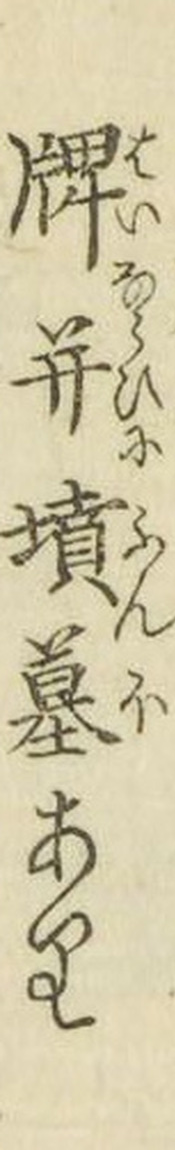牌幷墳墓あり
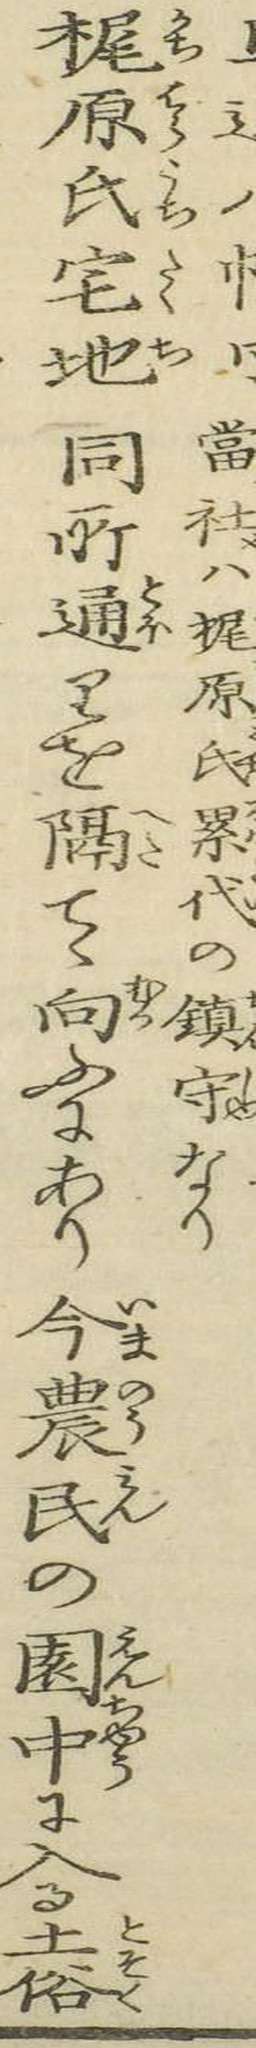梶原氏宅地同所通りを隔てゝ向ふにあり今農民の園中に入る土俗
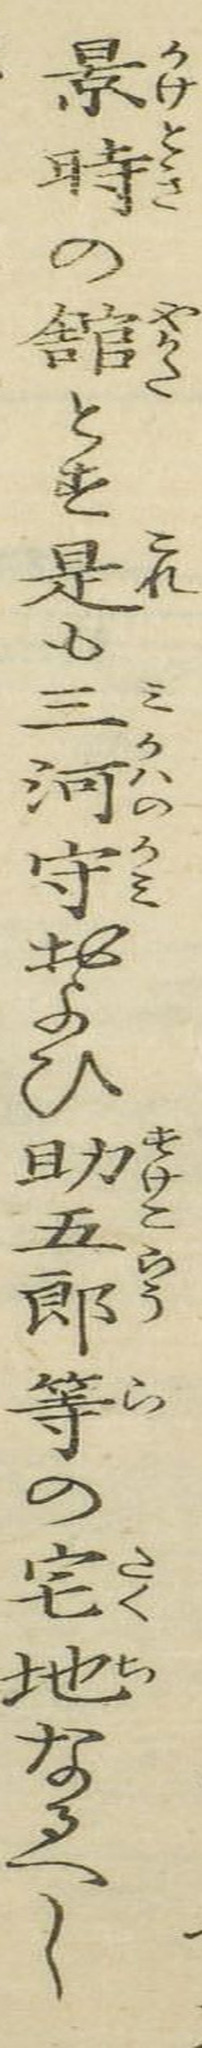景時の舘とす是も三河守およひ助五郎等の宅地なるへし
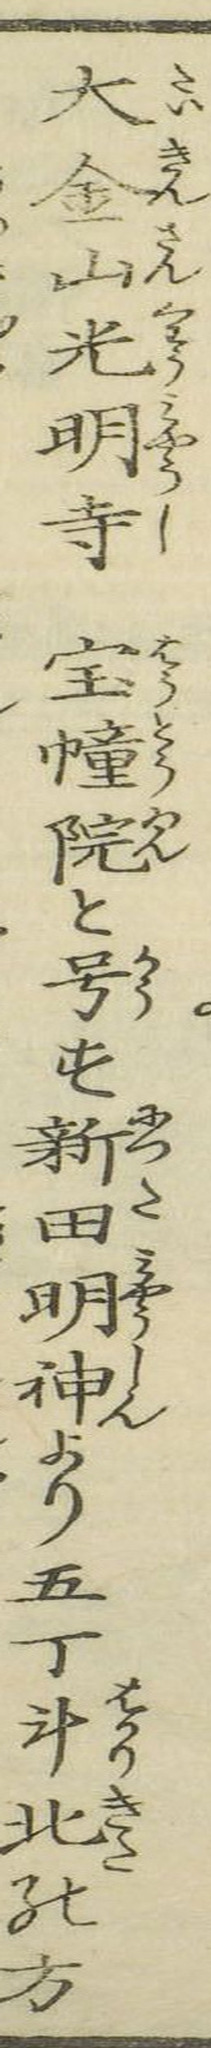大金山光明寺宝幢院と号す新田明神より五丁斗北の方

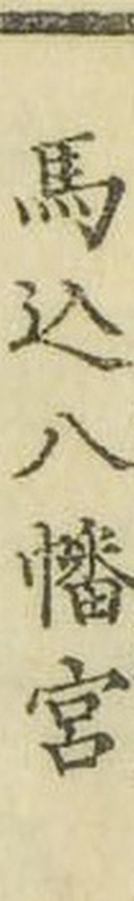馬込八幡宮
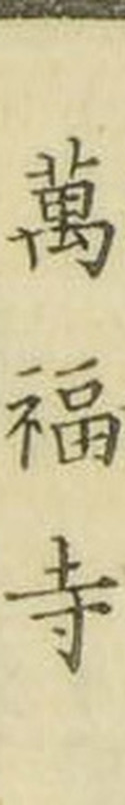萬福寺
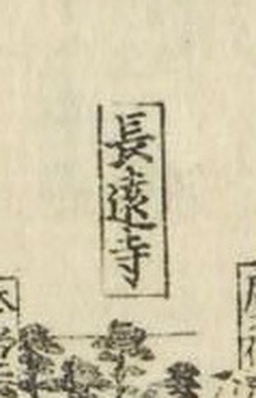長遠寺

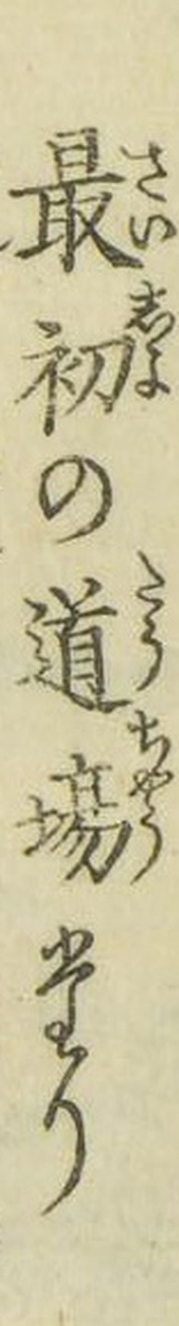最初の道塲たり
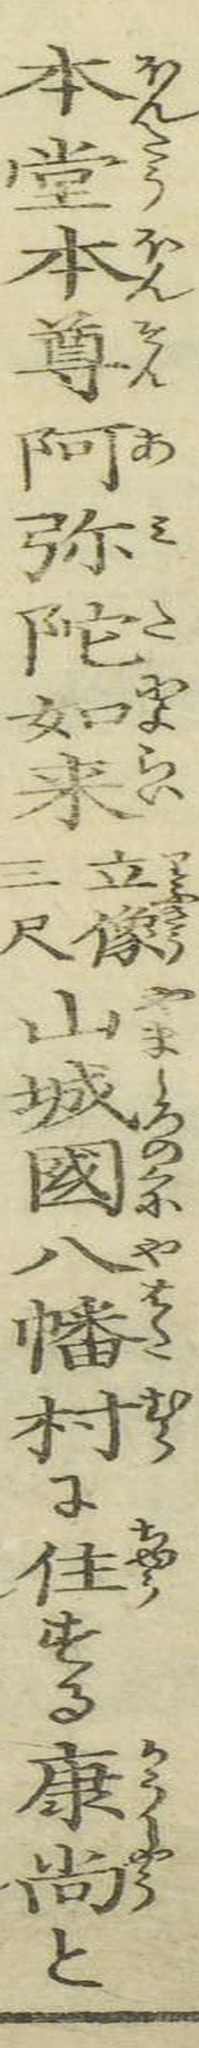本堂本尊阿弥陀如来立像三尺山城國八幡村に住する康尚と
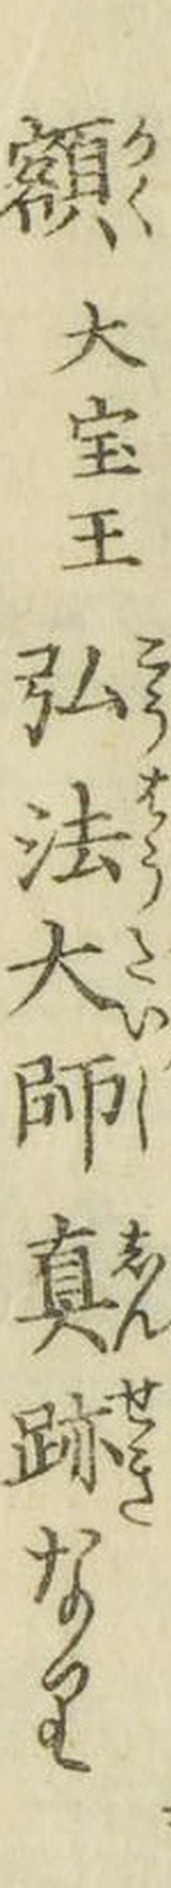額大宝王弘法大師真跡なり
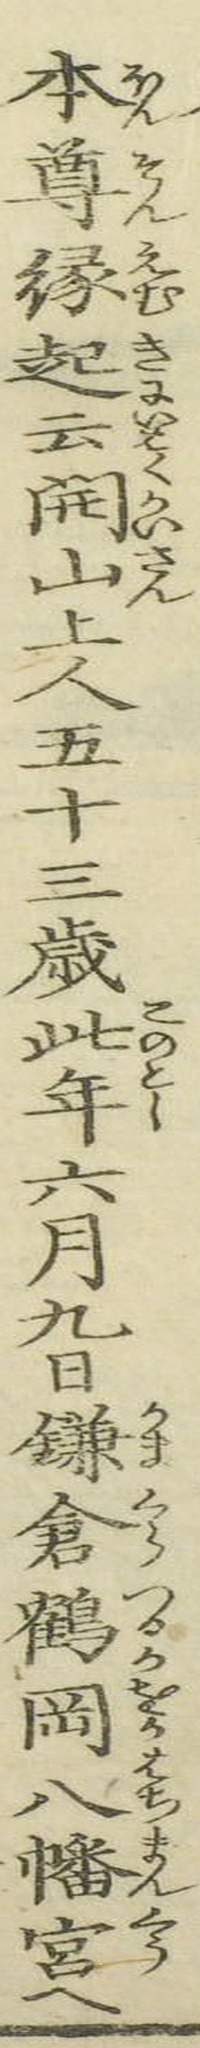本尊縁起云開山上人五十三歳此年六月九日鎌倉鶴岡八幡宮へ
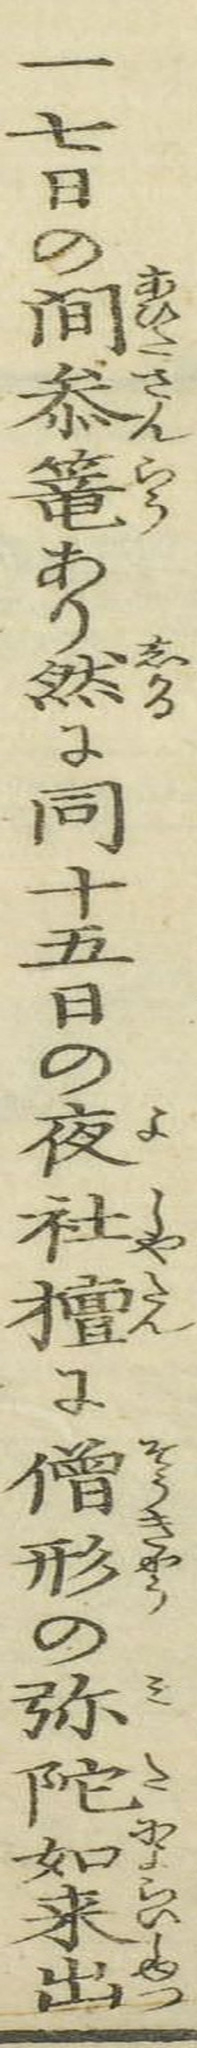一七日の間参篭あり然に同十五日の夜社檀に僧形の弥陀如来出
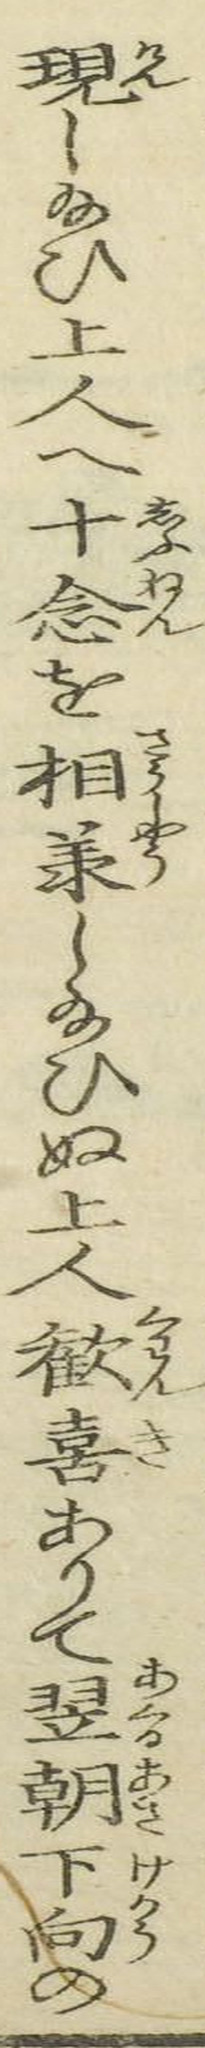現し給ひ上人へ十念を相承し給ひぬ上人歓喜ありて翌朝下向の
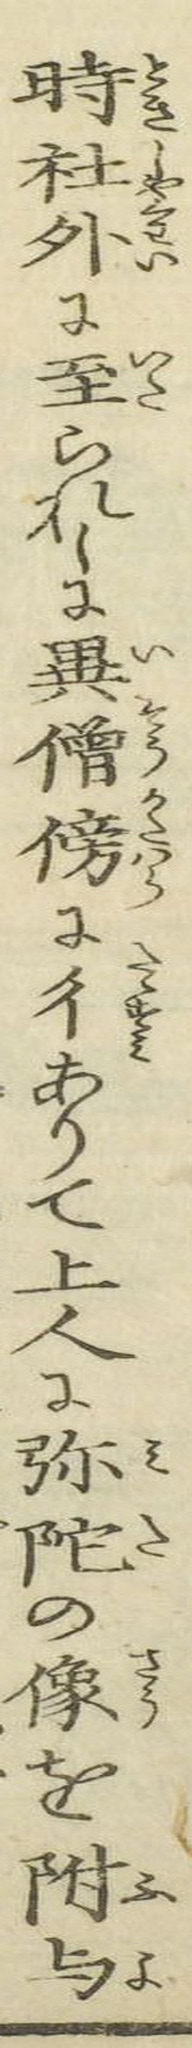時社外に至られしに異僧傍に彳ありて上人に弥陀の像を附与
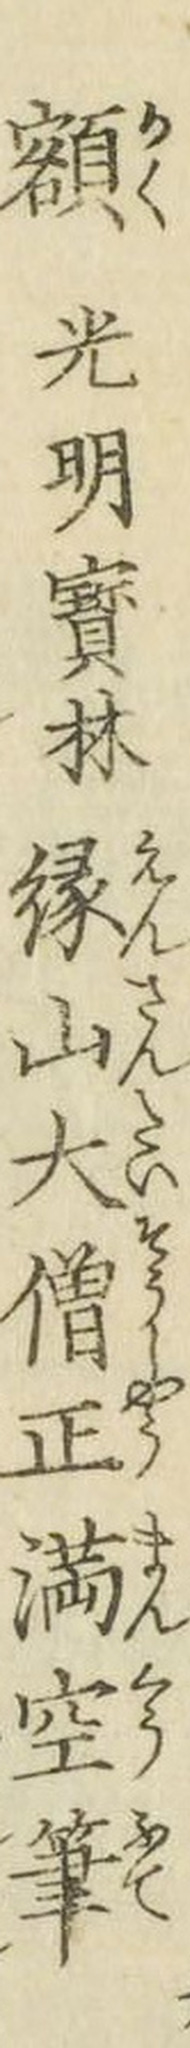額光明寳林縁山大僧正満空筆
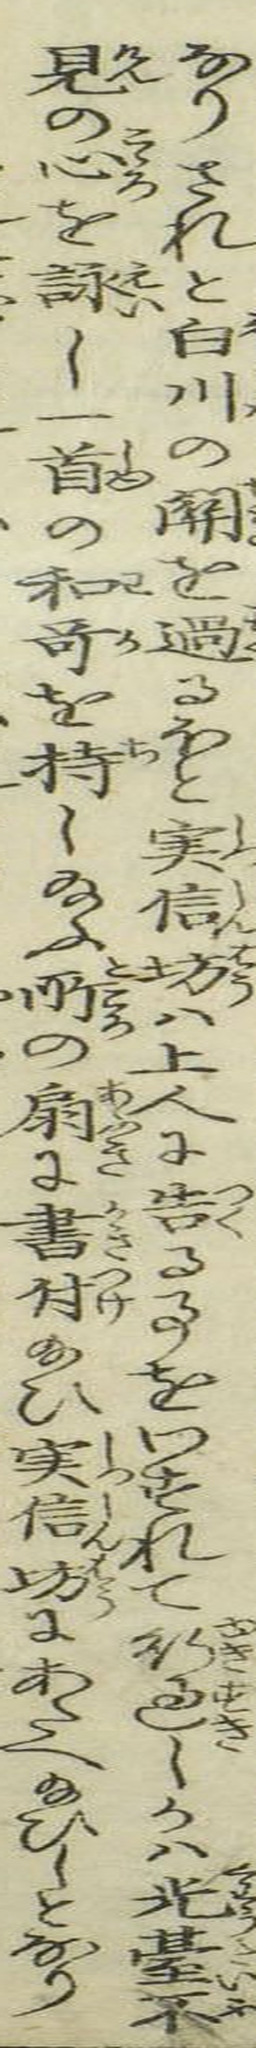見の心を詠し一首の和哥を持し給ふ所の扇に書付給ひ実信坊にあたへ給ひしとなり
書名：江戸名所図会 20巻 巻之4
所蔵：東京学芸大学教育コンテンツアーカイブ
